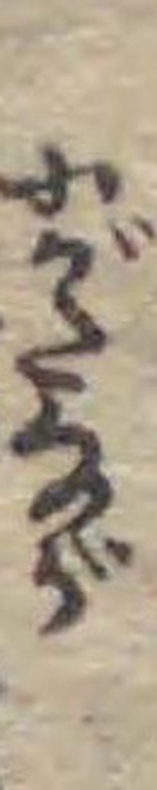小がたなが
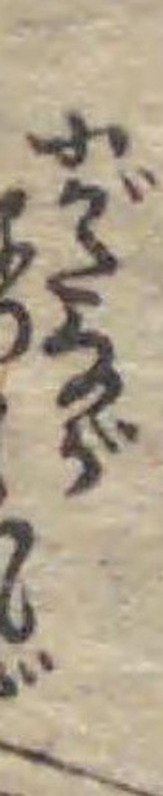小がたなが
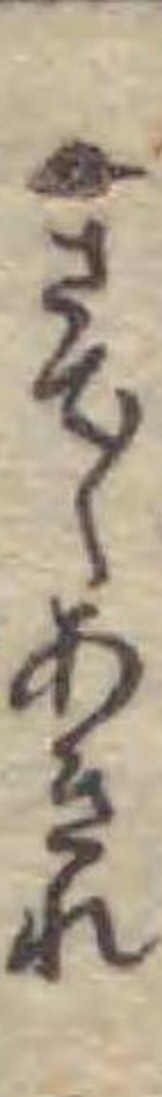さて〳〵あきれ
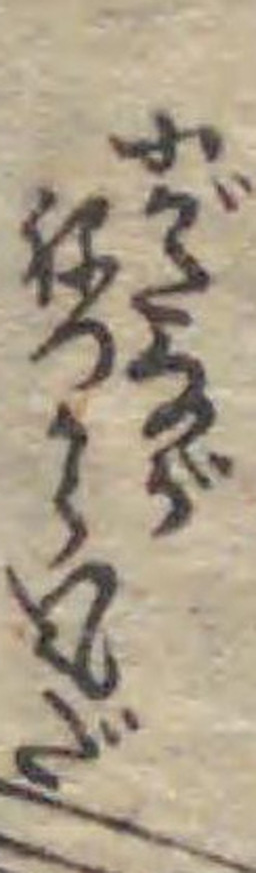ねつからいもだ
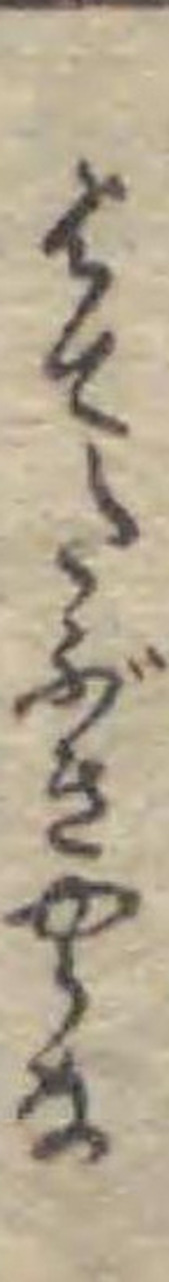はてたぶきやうな
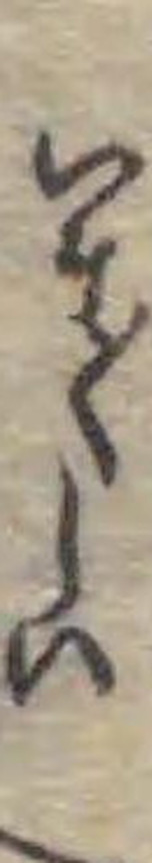いま〳〵しい
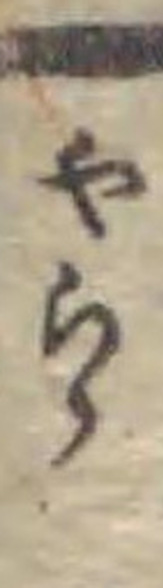やらう
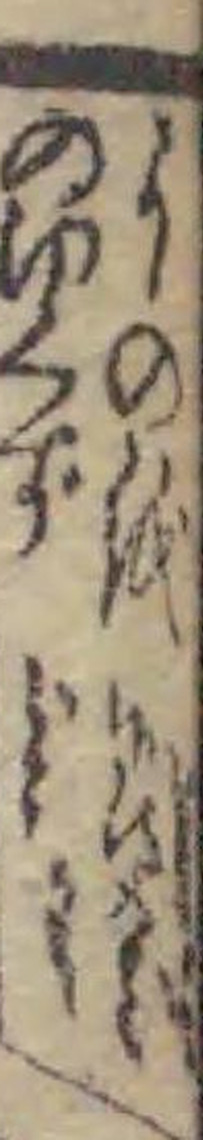の切くず
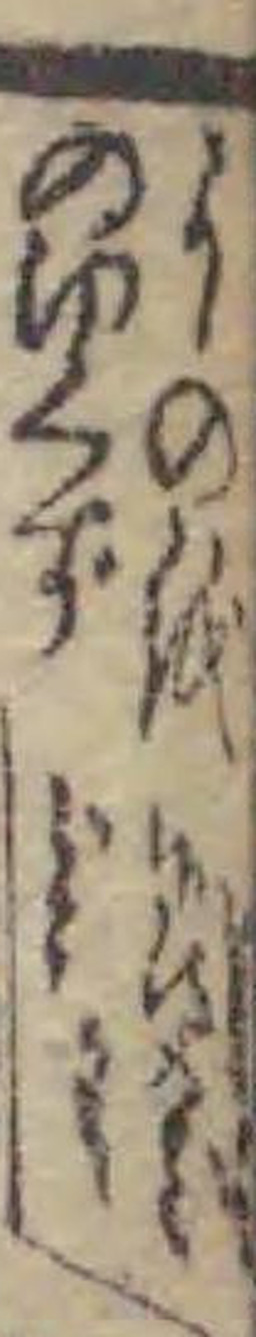の切くず
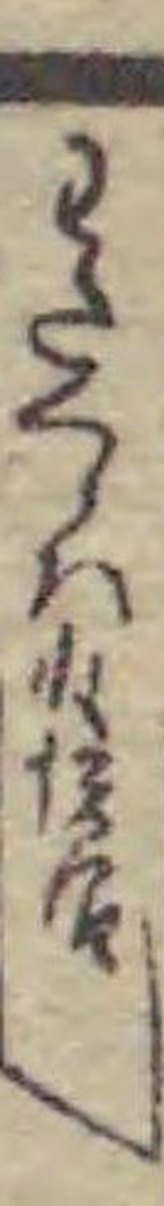わたくしはとしの
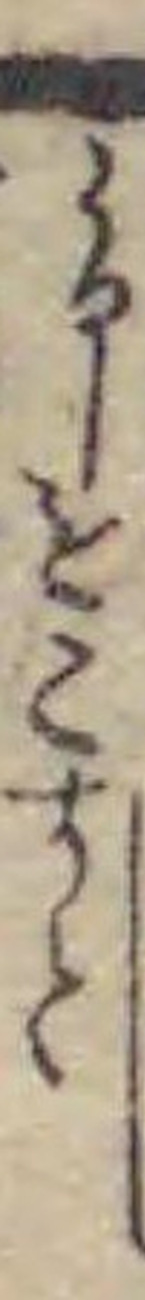うるしをこすと
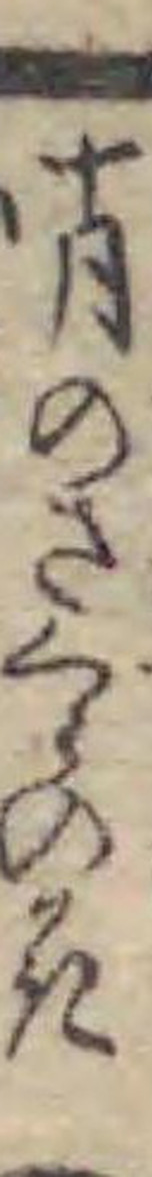十月のさくらの花
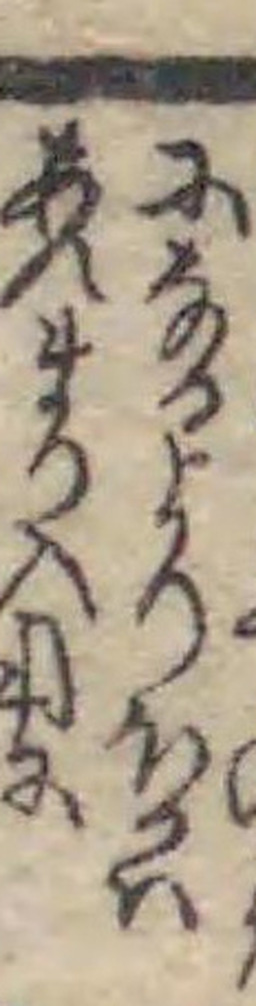あんまり入用に
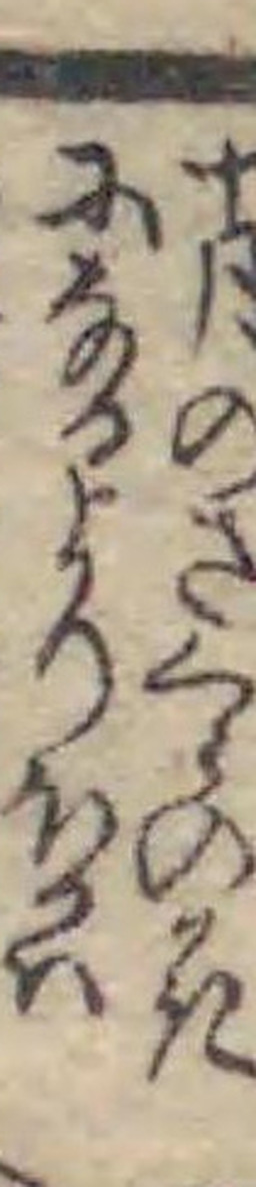になるよりほかは
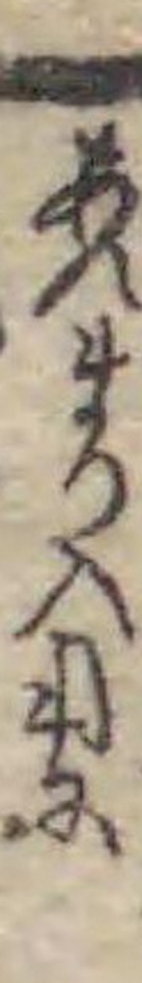あんまり入用に
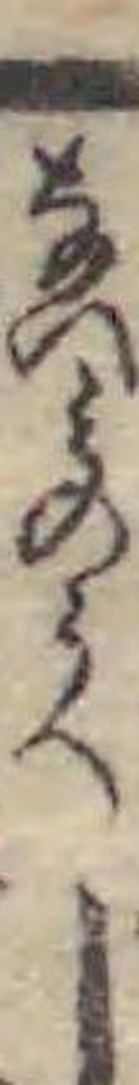ないみのうへ
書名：紙屑身上噺 : 3巻
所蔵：国立国会図書館 National Diet Library, JAPAN
